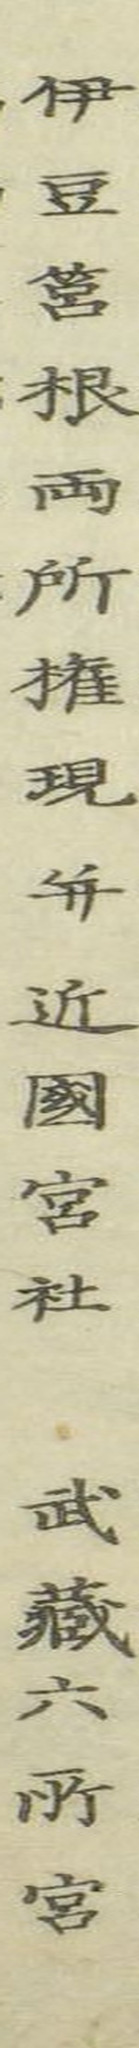伊豆筥根両所権現并近国宮社武蔵六所宮

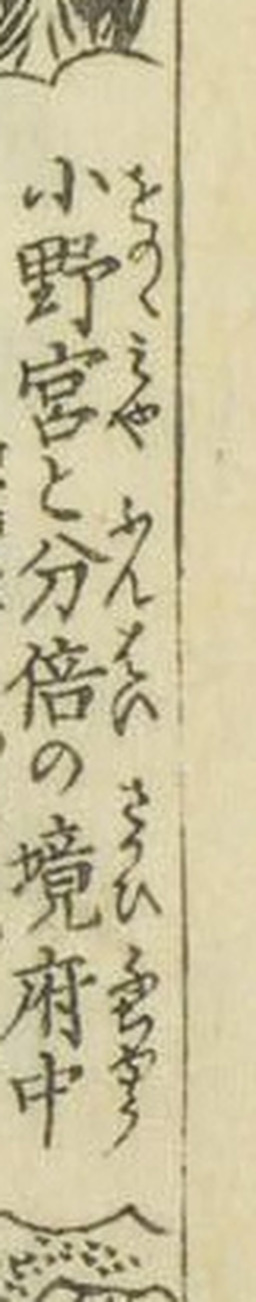小野宮と分倍の境府中
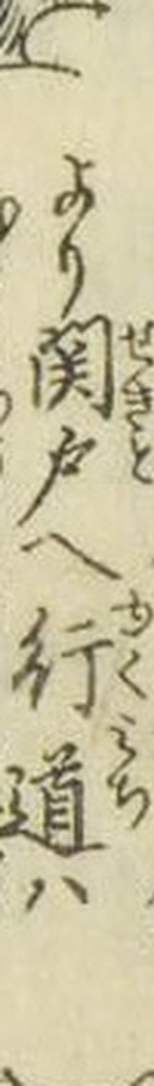より関戸へ行道は
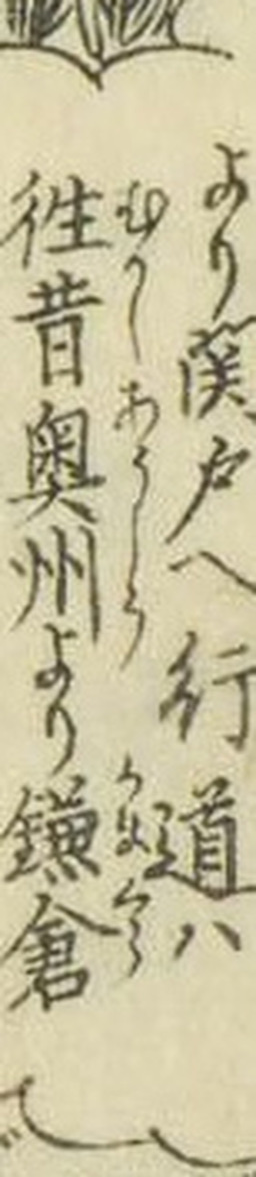往昔奥州より鎌倉
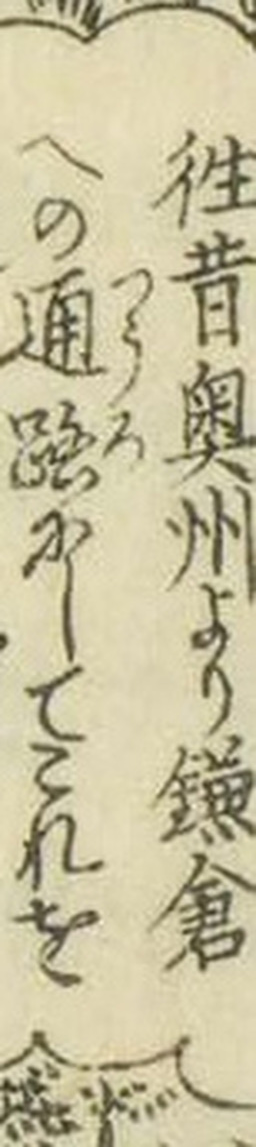への通路にしてこれを
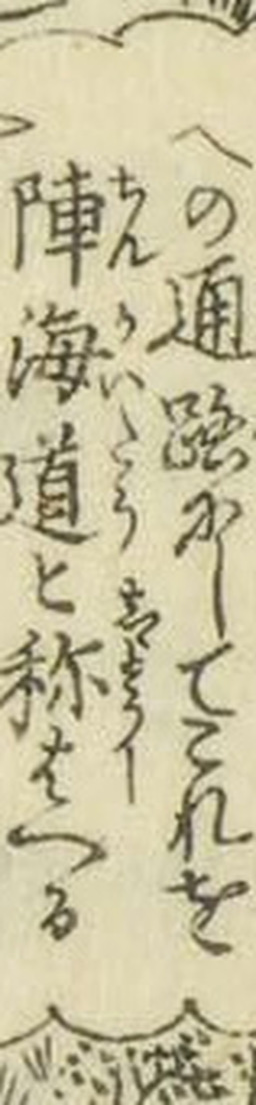陣海道と称はへる
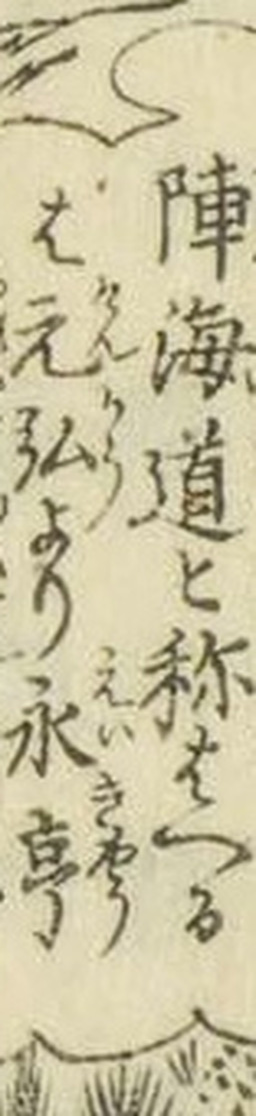は元弘より永享
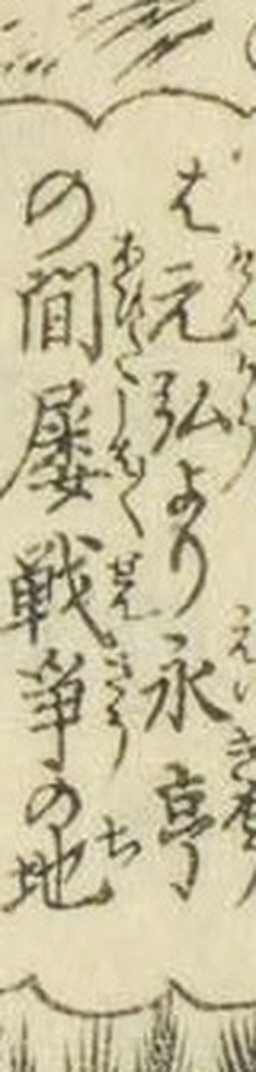の間屡戦争の地
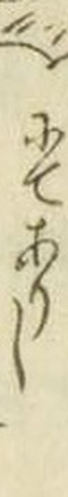にてありし
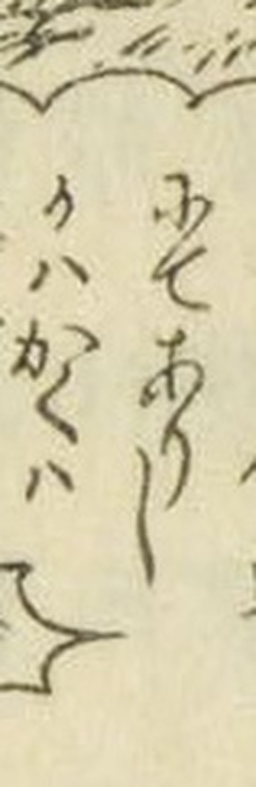かはかくは
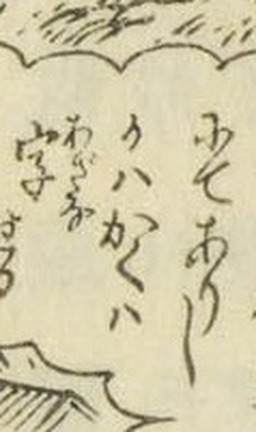かはかくは
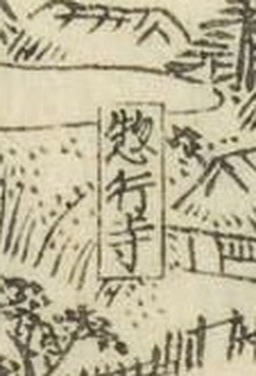惣行寺
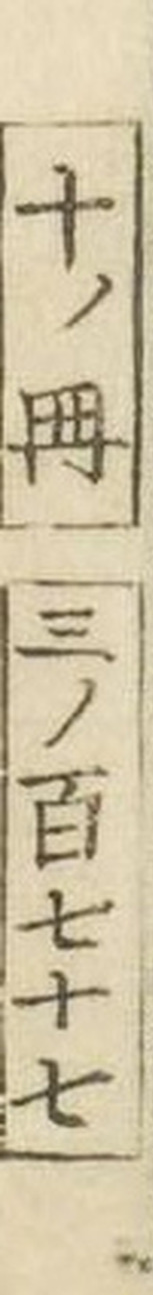十ノ冊三ノ百七十七

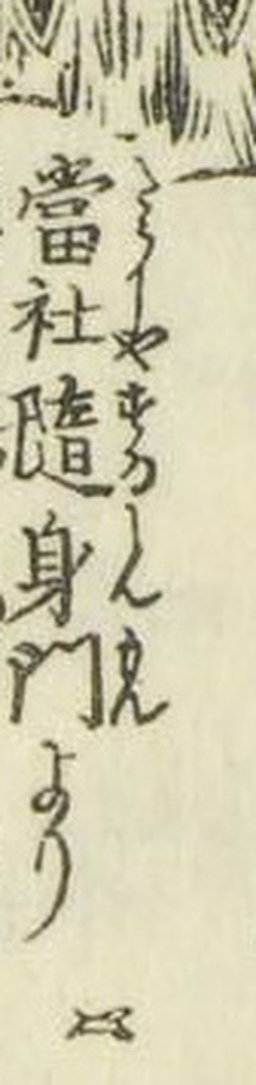当社随身門より
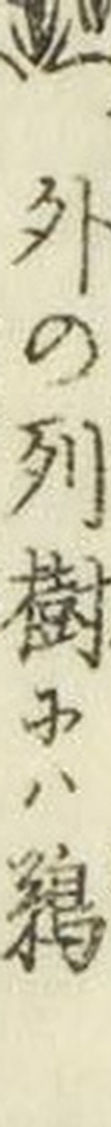外の列樹には鵜
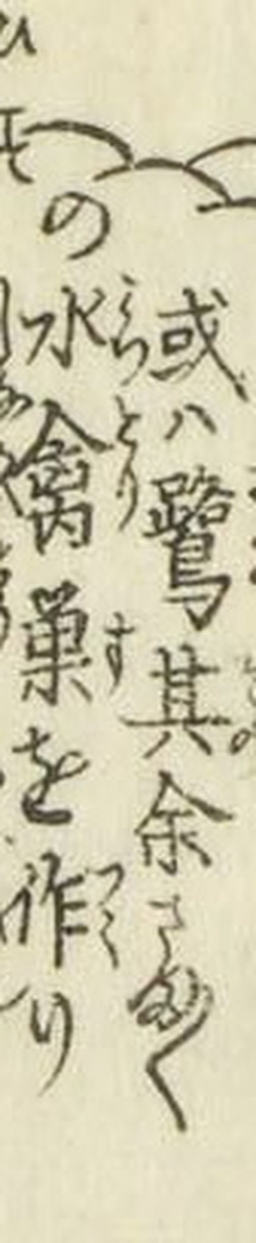の水禽巣を作り
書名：江戸名所図会 20巻 巻之10
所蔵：東京学芸大学教育コンテンツアーカイブ
